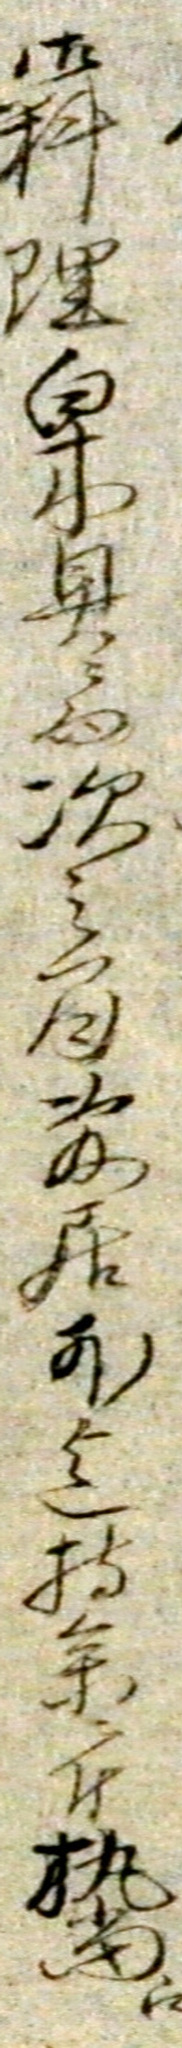御料理白木具ニ而次之間敷居外迄持参ニ付執當江
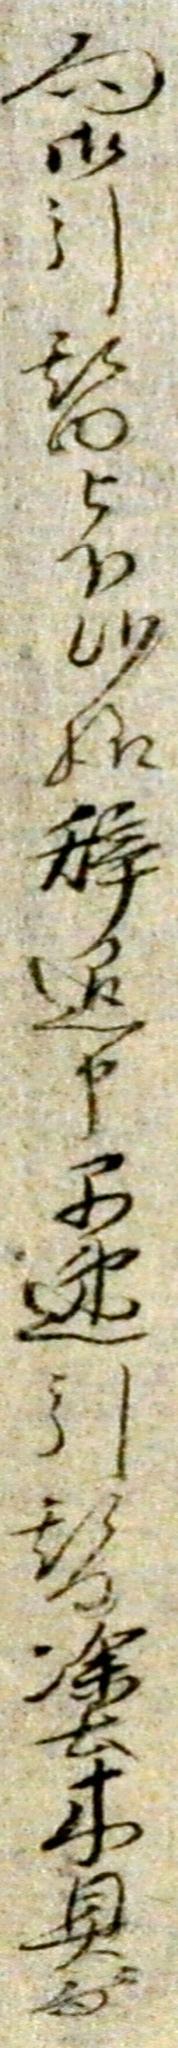向御引替ヒ下候様辞退申早速引替塗木具ニ而
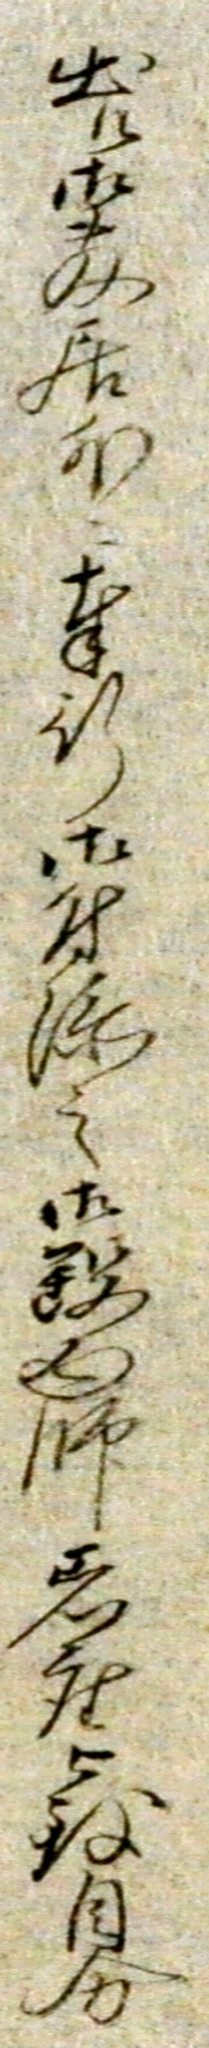出ル御敷居外二奉行御付添之御医師着座ヒ致自分
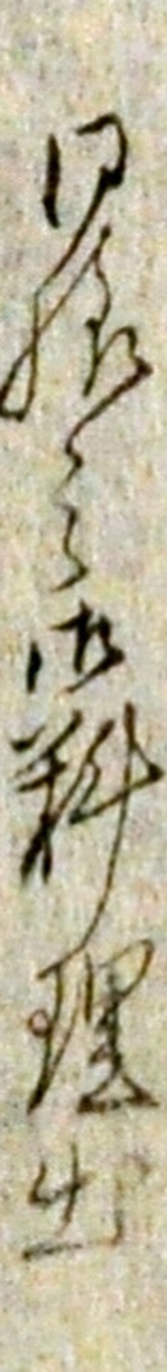同様之御料理出
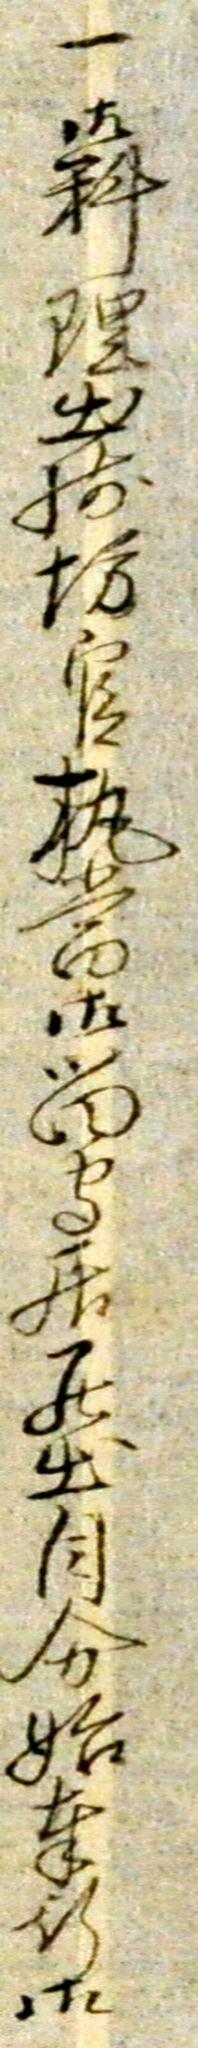一御料理出揃坊官執當御留守居罷出自分始奉行御
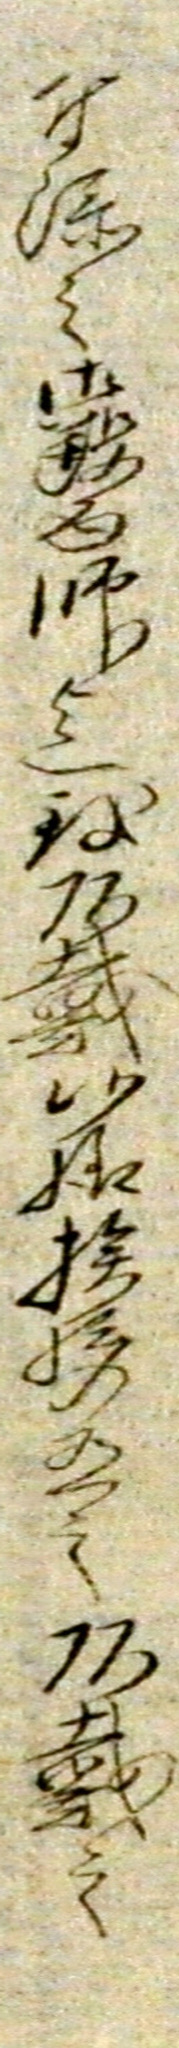付添之御医師迄致頂戴候様挨拶有之頂戴之
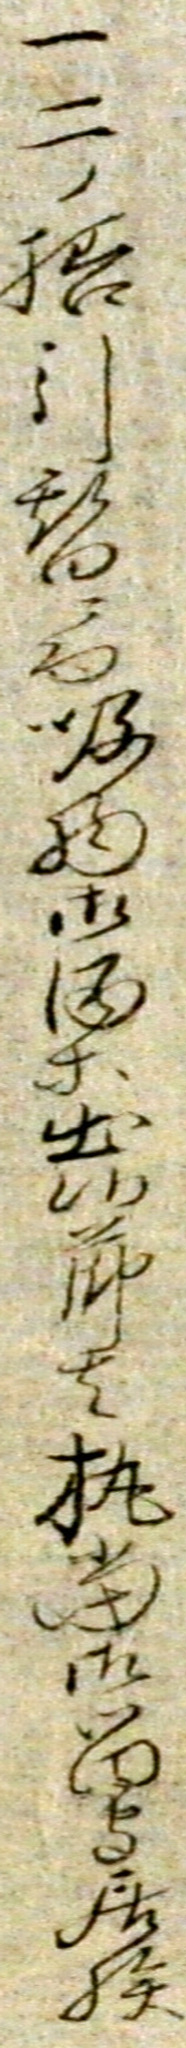一二之膳引替ニ而吸物御酒抔出候節者執當御留守居挨
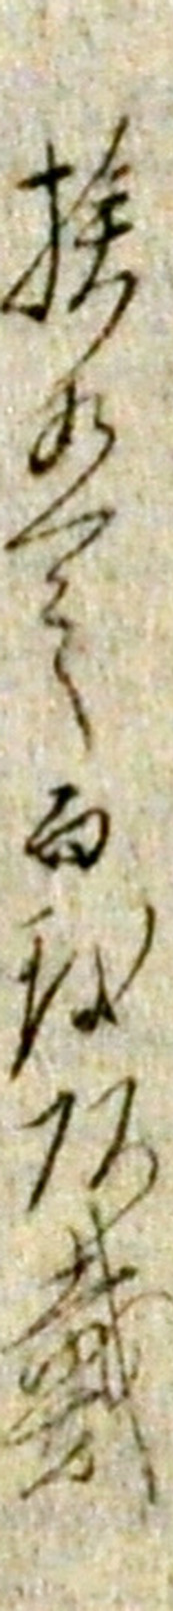拶有之而致頂戴
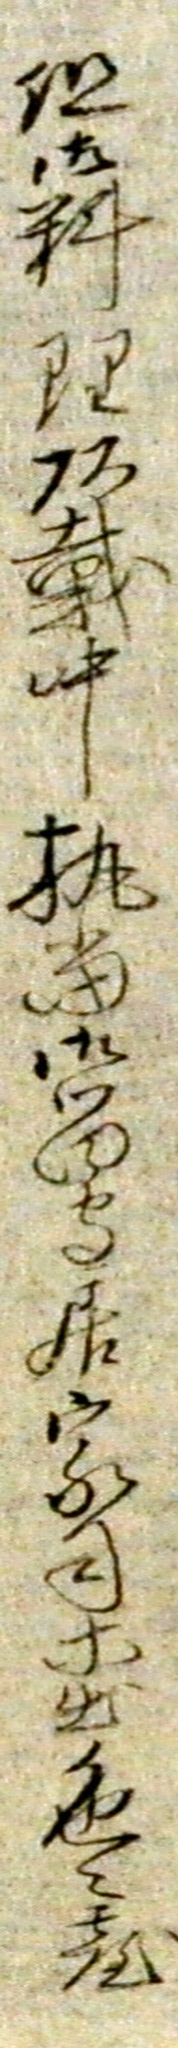但御料理頂戴中執當御留守居家司抔出色二臺
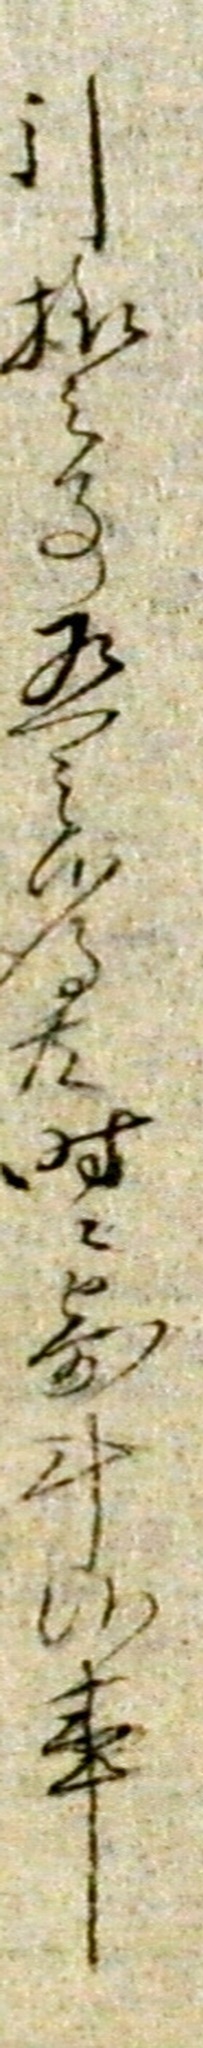引様之事有之候得共時ニ寄斗候事
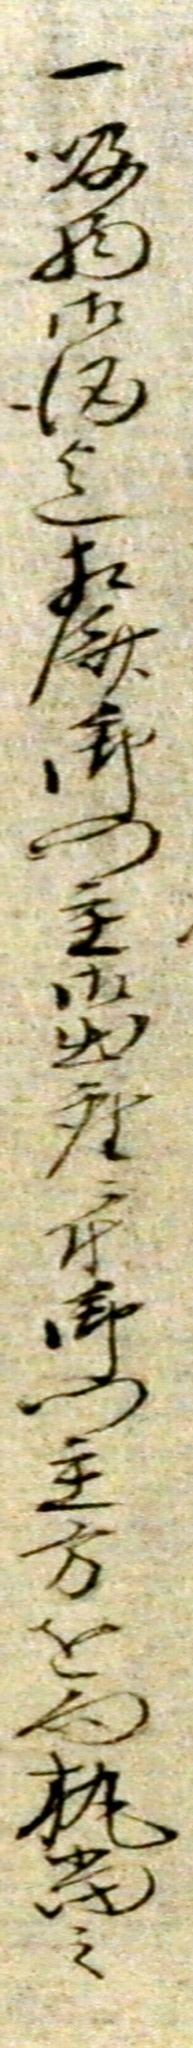一吸物御酒迄相済御門主御出座ニ付御門主方を向執當之
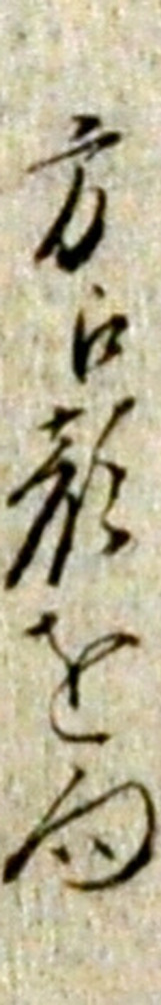方江顔を向
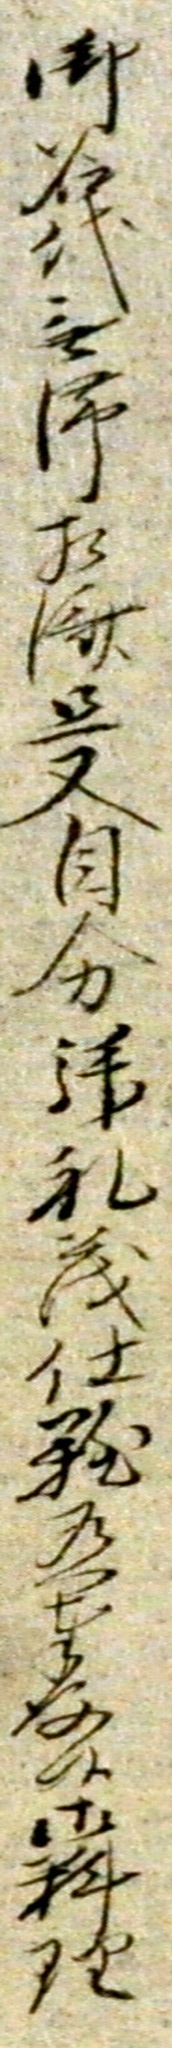御名代無滞相済且又自分拝礼茂仕難有奉存候御料理
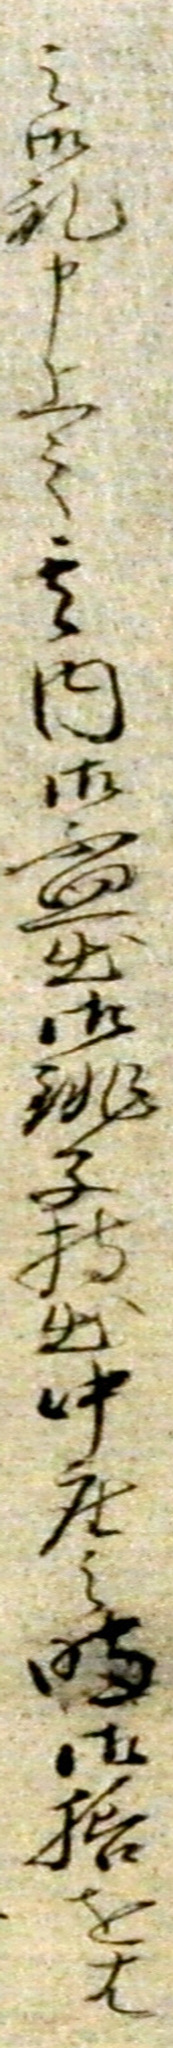之御礼申上之其御盃出御銚子持出中座之時御膳を者
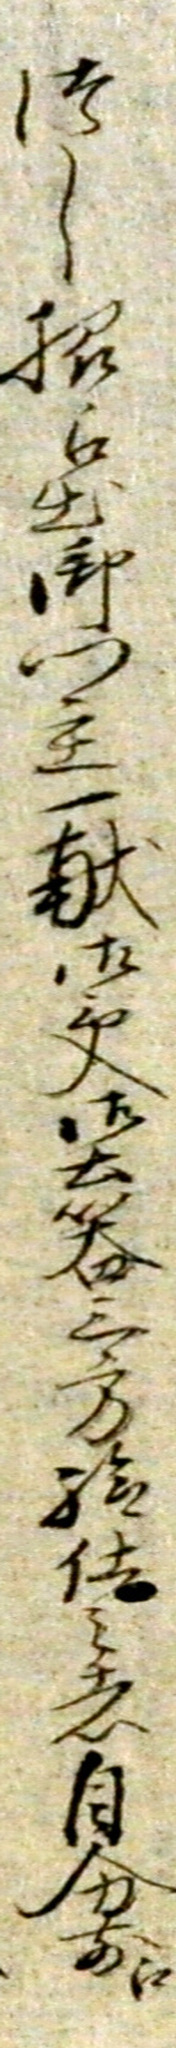徒し脇江出御門主一献御受御土器三方給仕之者自分前江
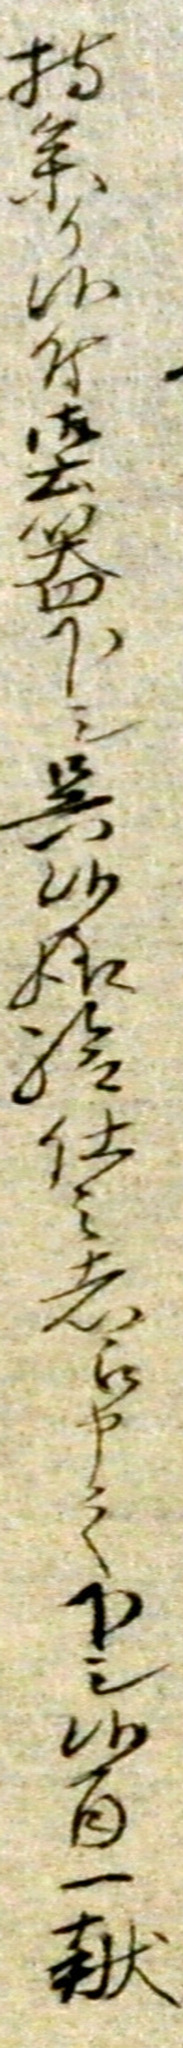持参り候付御土器下シ呉候様給仕之者江申之下シ候間一献
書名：日光御名代相勤候節ノ留
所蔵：伊那市立高遠町図書館・合同会社AMANE
